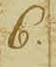6.
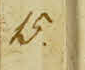15.
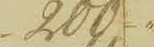200
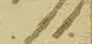11.
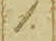1.
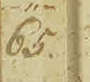65.
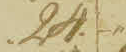24.
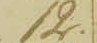12.
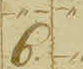6.
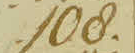108.
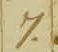7.
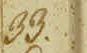33.
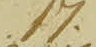17.
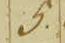5.
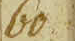60
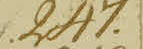247.
